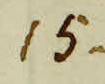15
